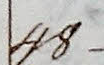48
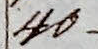40
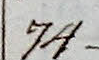74
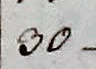30
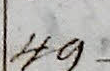49
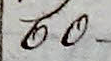60
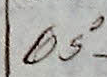65
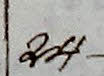24
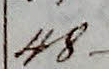48
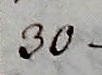30
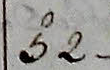52
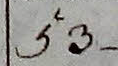53
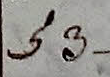53
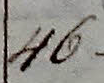46
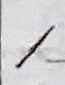1
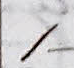1
